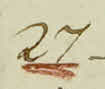27
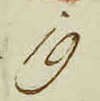19
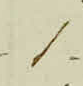1
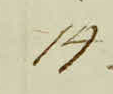14
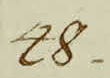48
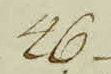46
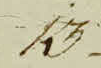13
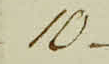10
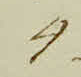4
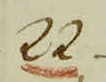22
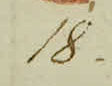18
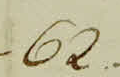62
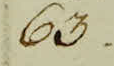63
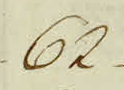62
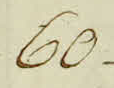60
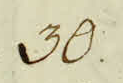30
